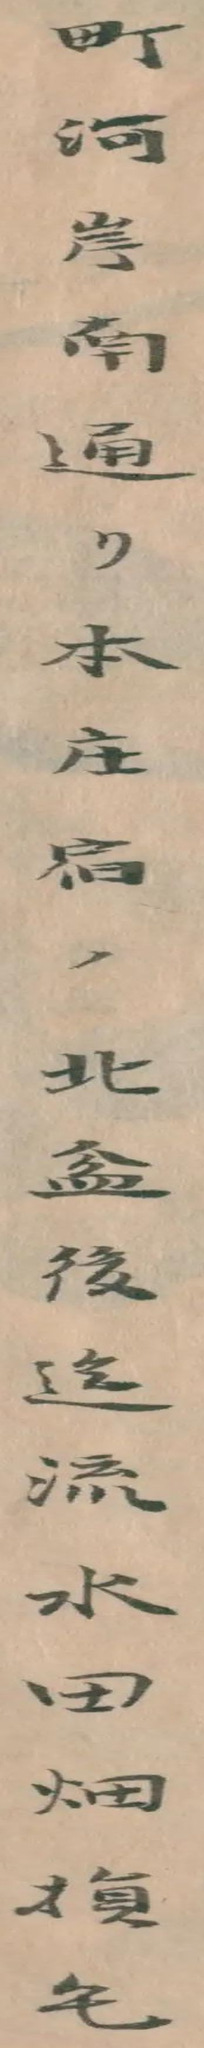町河岸南通り本庄宿ノ北盆後迄流水田畑損毛
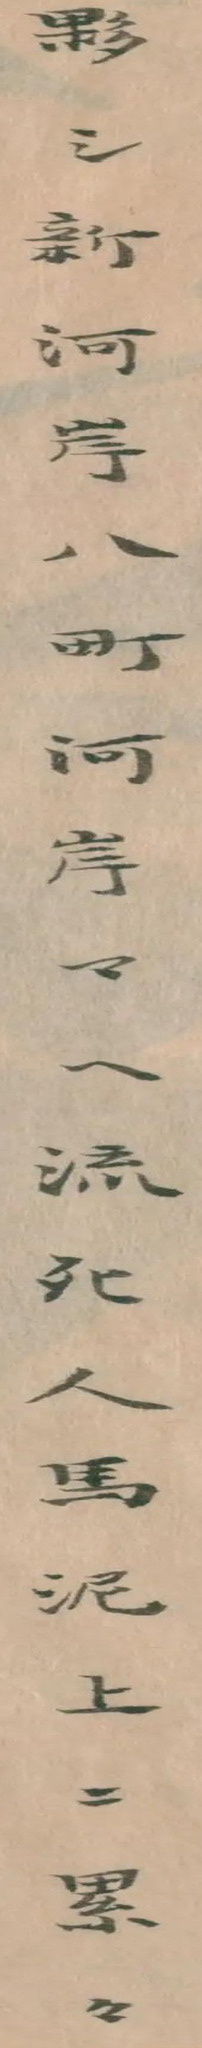夥シ新河岸八町河岸マへ流死人馬泥上二累々
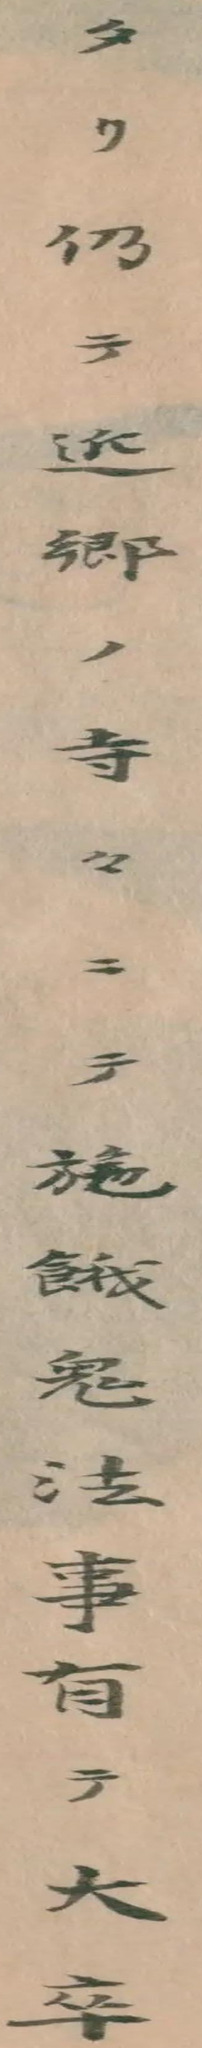タリ仍テ近郷ノ寺々ニテ施餓鬼法事有テ大卒
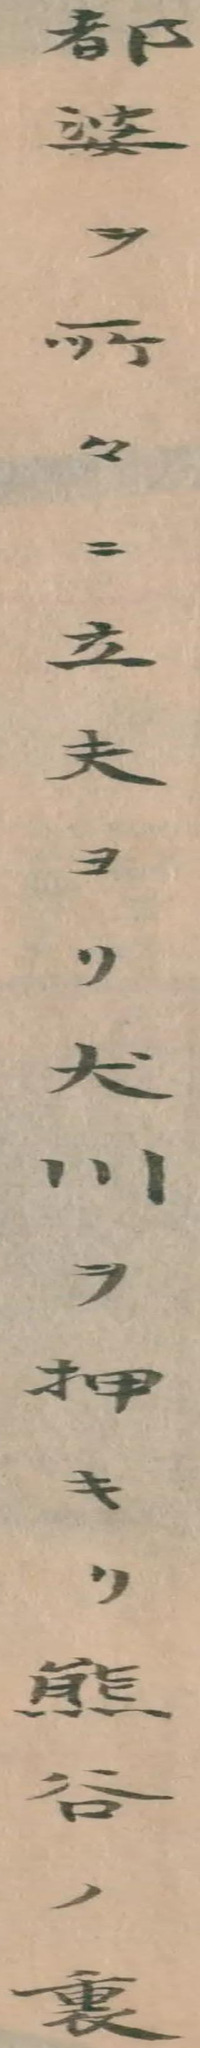都婆ヲ所々二立夫ヨリ大川ヲ押キリ熊谷ノ裏
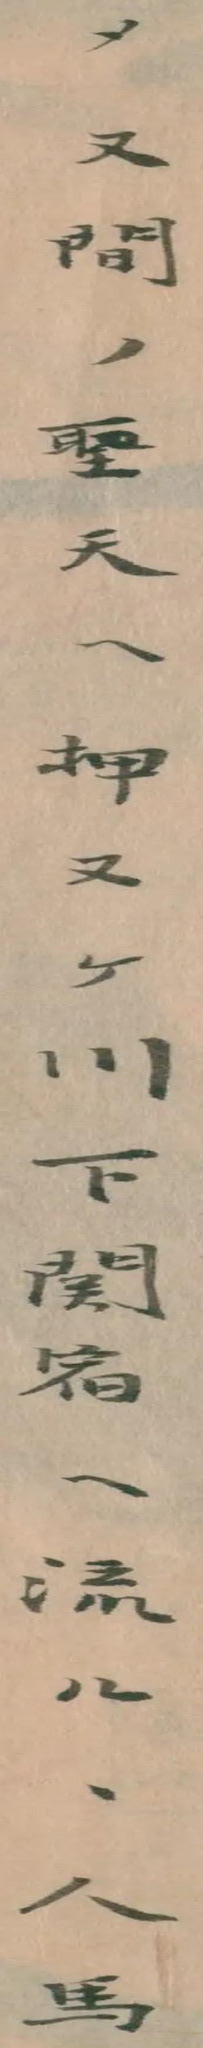メヌ間ノ聖天へ押ヌケ川下関宿へ流ルゝ人馬
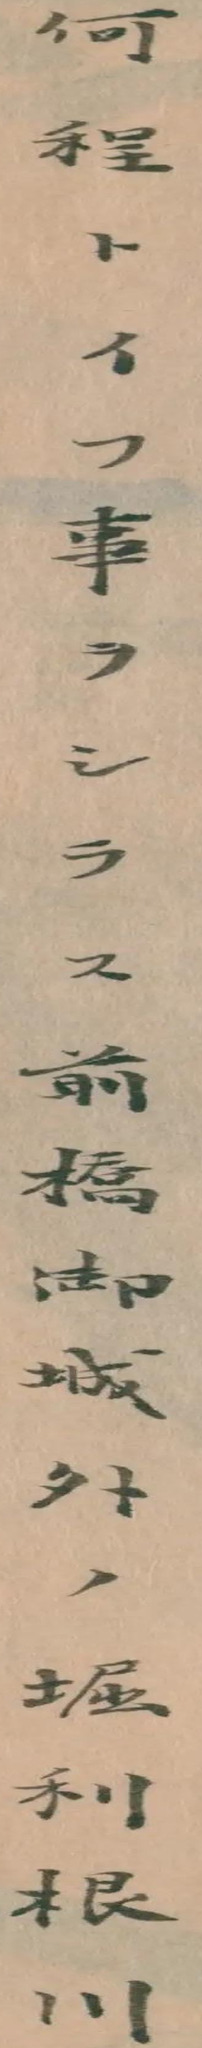何程トイフ事ヲシラス前橋御城外ノ堀利根川
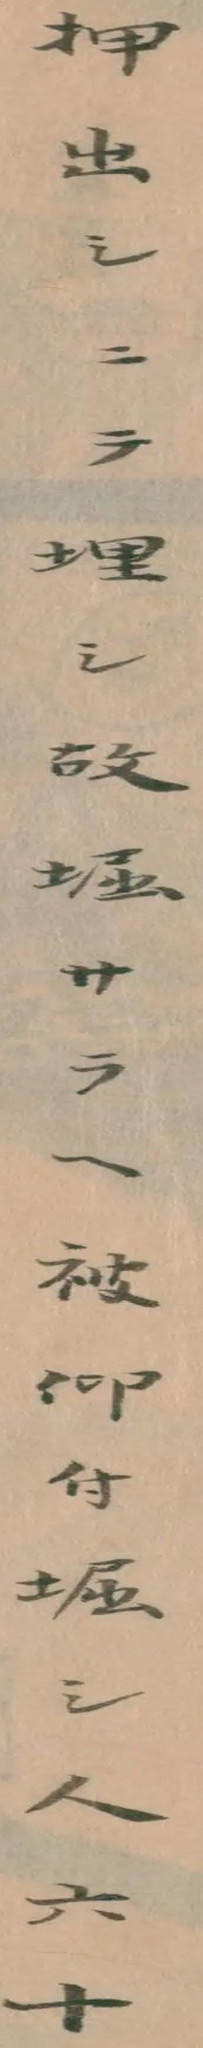押出シニテ埋シ故堀サラへ被仰付堀シ人六十
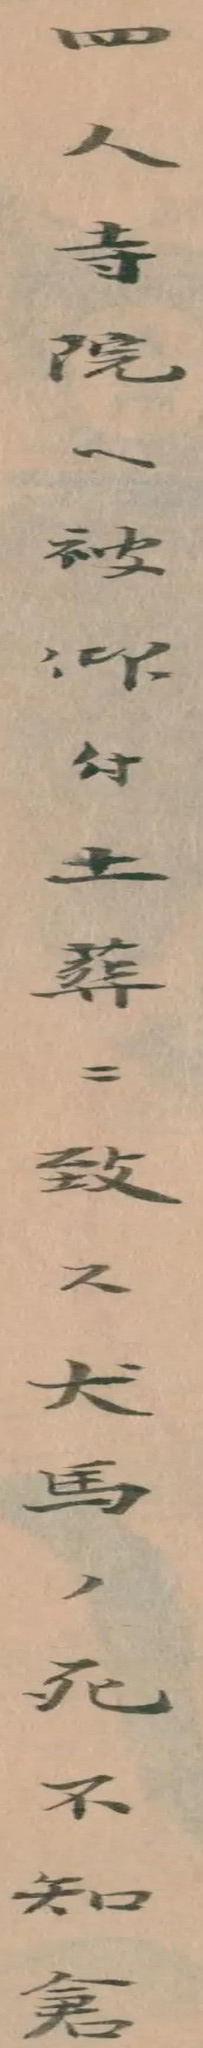四人寺院へ被仰付土葬ヲ致ス犬馬ノ死不知倉
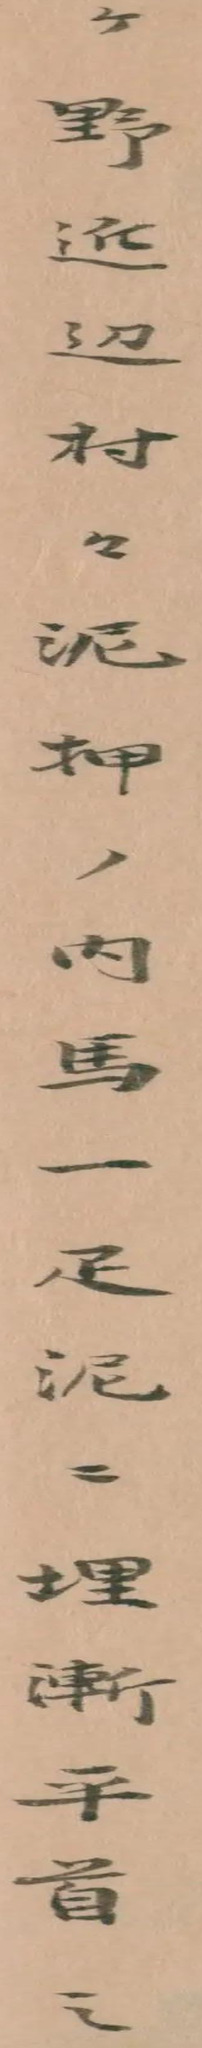ヶ野近辺村々泥押ノ内馬一疋泥二埋漸平首ミ
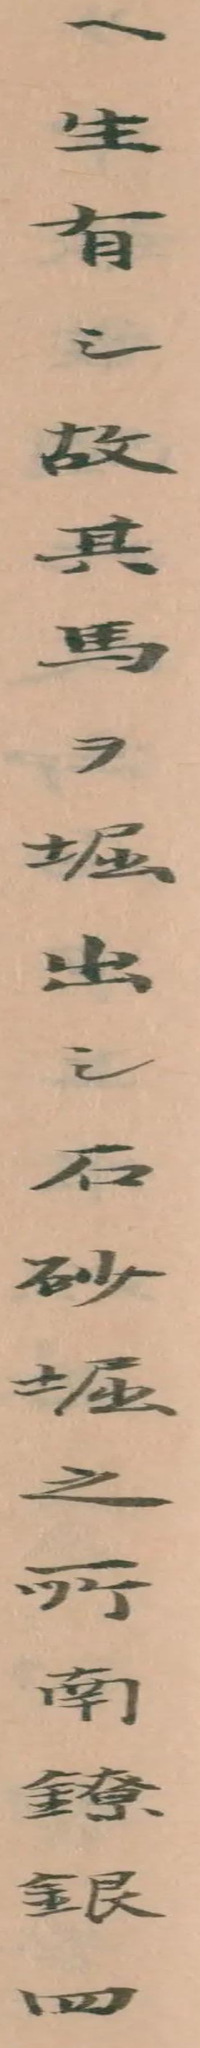へ生有シ故其馬ヲ堀出シ石砂堀之所南凌鐐銀
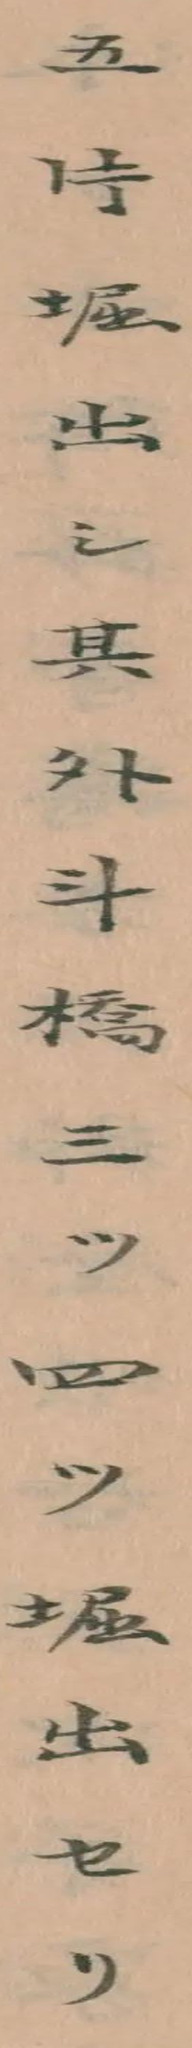五片堀出シ其外斗橋三ッ四ッ堀出セリ
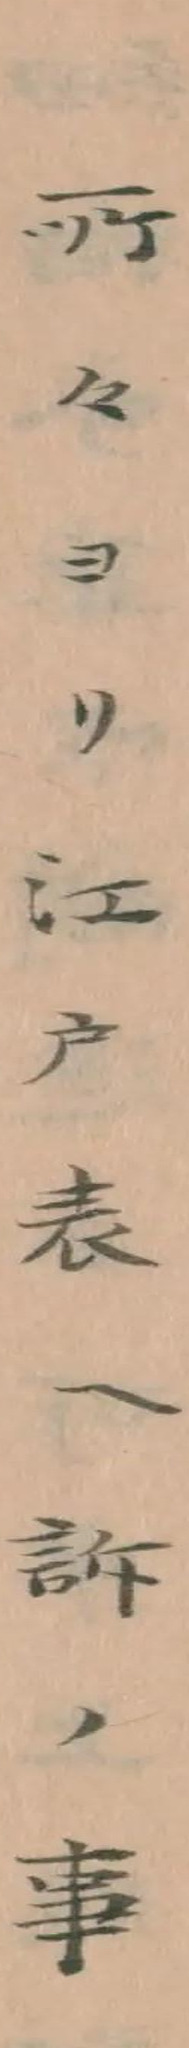所々ヨリ江戸表へ訴ノ事
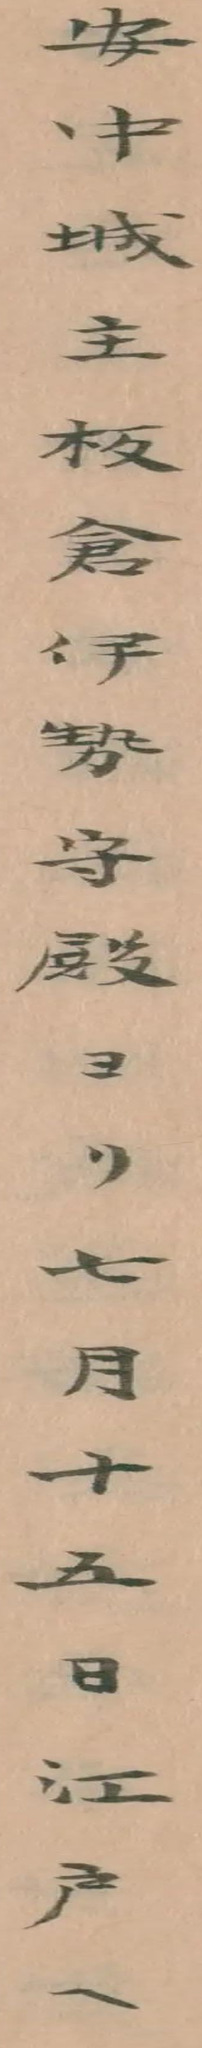安中城主板倉伊勢守殿ヨリ七月十五日江戸へ
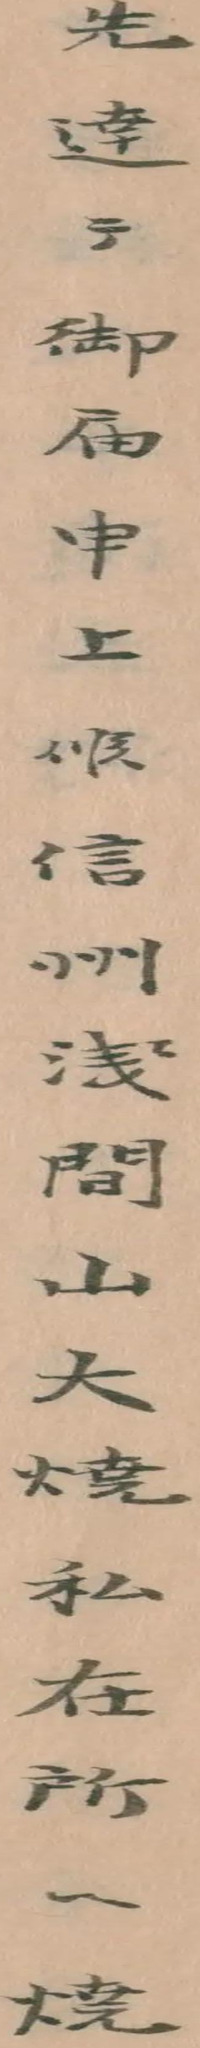先達テ御届申上候信州浅間山大焼私在所へ焼
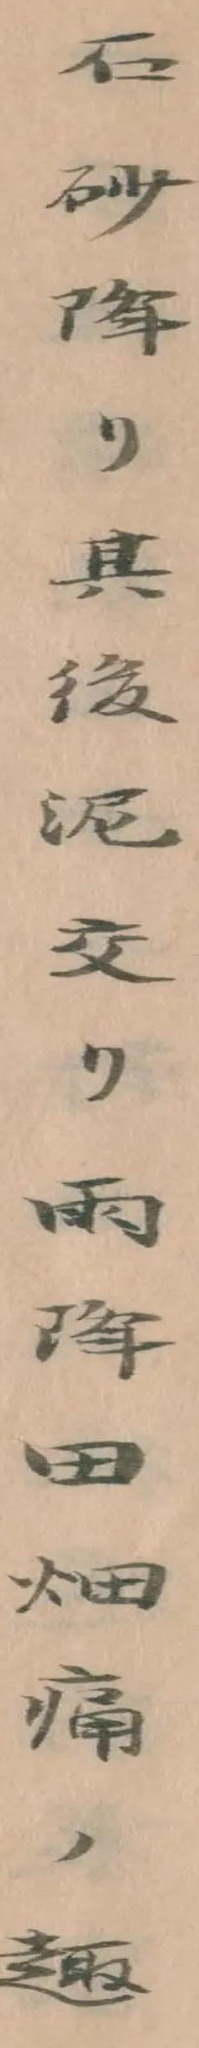石砂降り其後泥交り雨降田畑痛ノ趣
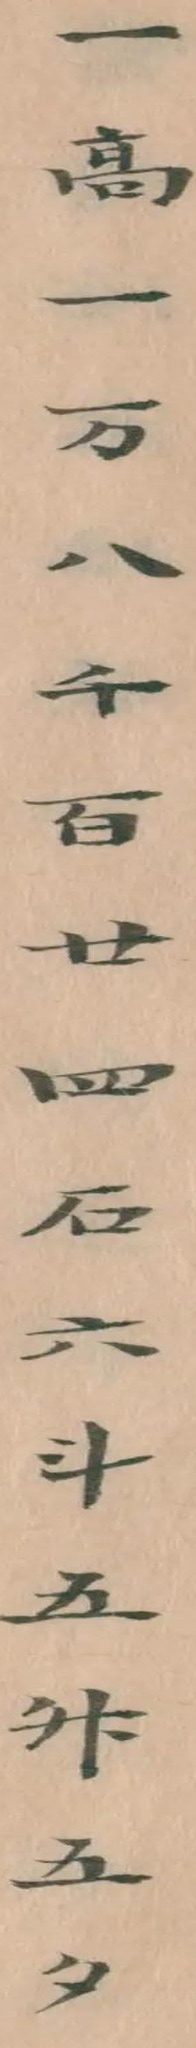一高一万八千百廿四石六斗五升五夕
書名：地災撮要. 巻3(地震之部)-巻4(噴火之部)
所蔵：国立国会図書館 National Diet Library, JAPAN
